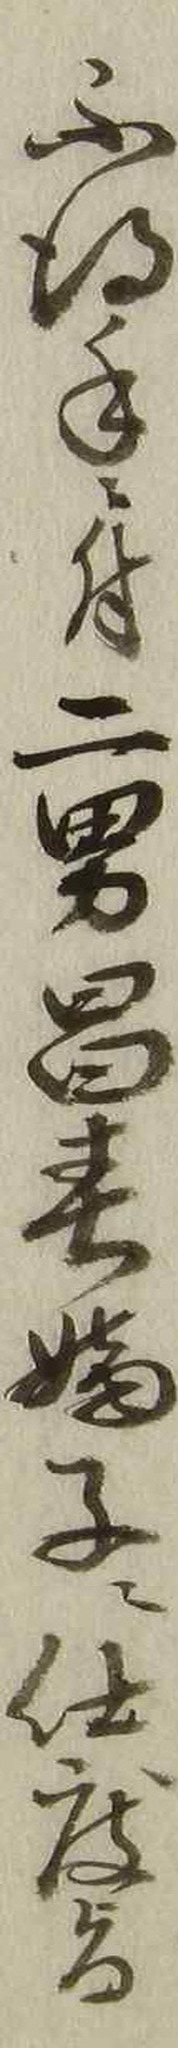不得手ニ付二男昌春嫡子ニ仕度旨
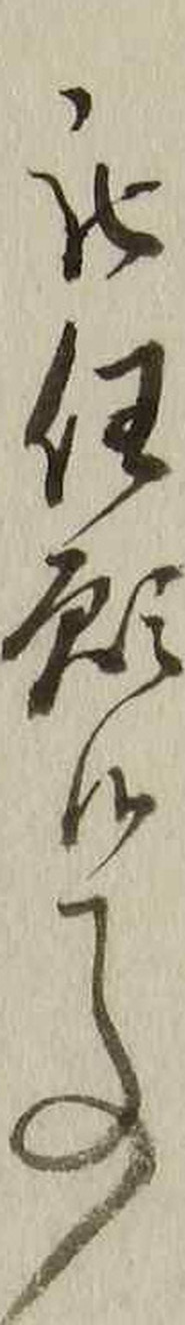被任願候事
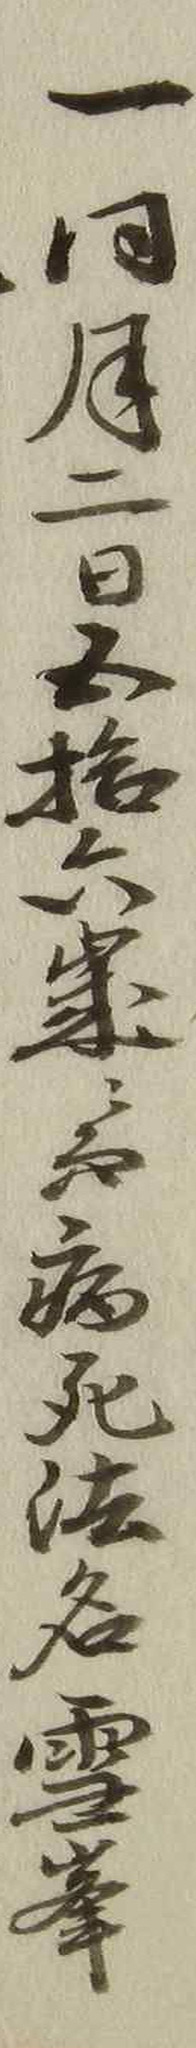一同月二日五拾六歳ニ而病死法名雪峯
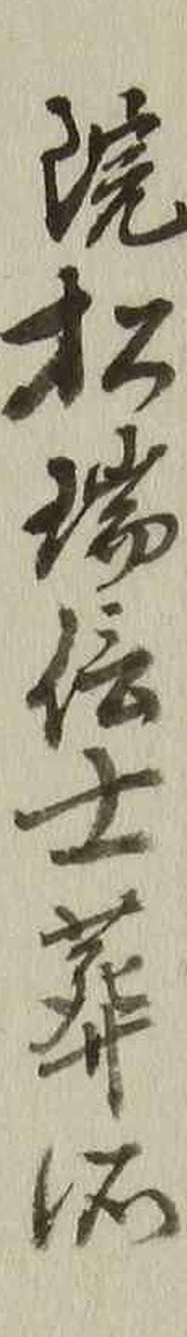院松瑞信士葬所
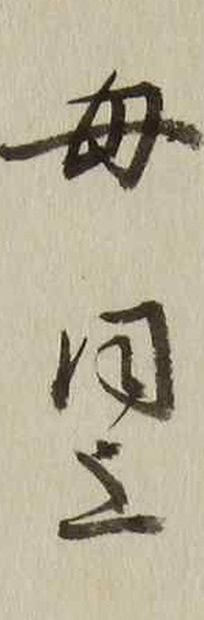母同上
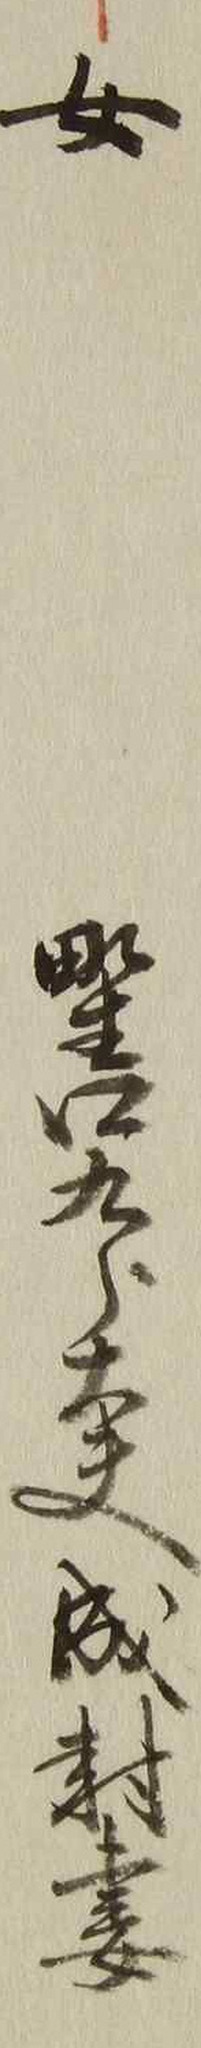女野口九郎太夫成封妻
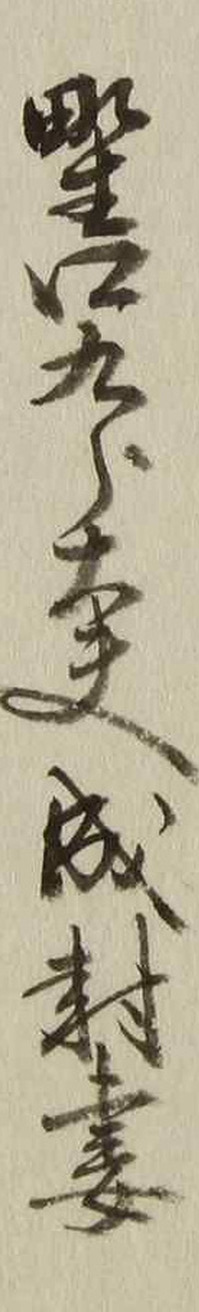女野口九郎太夫成封妻
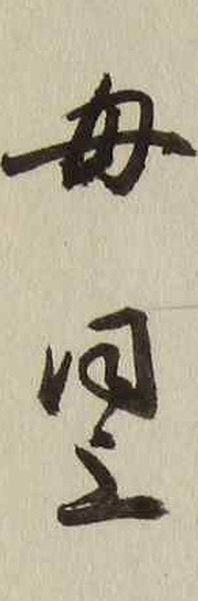母同上
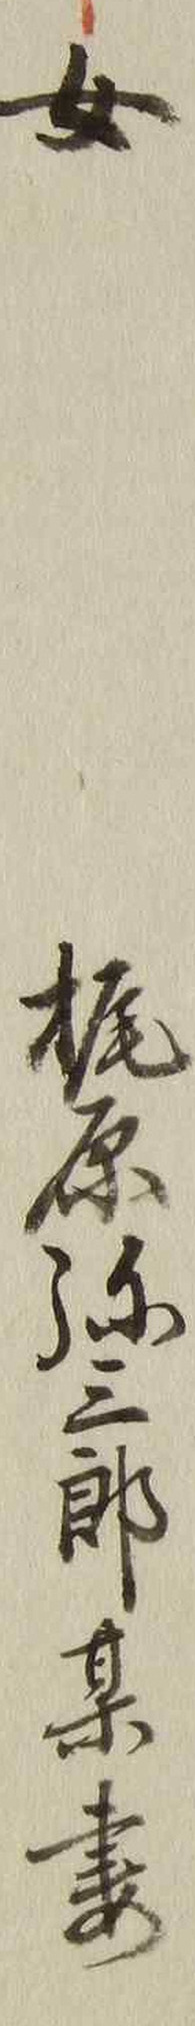女梶原弥三郎某妻
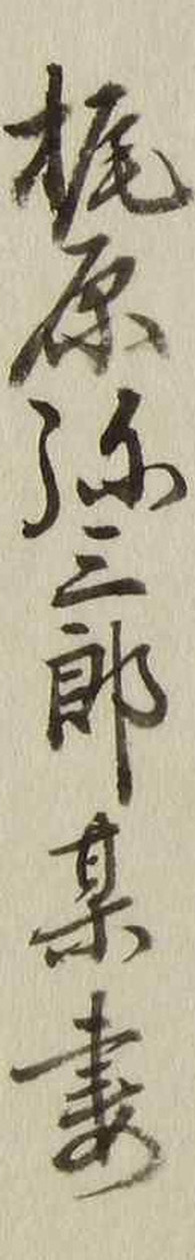女梶原弥三郎某妻
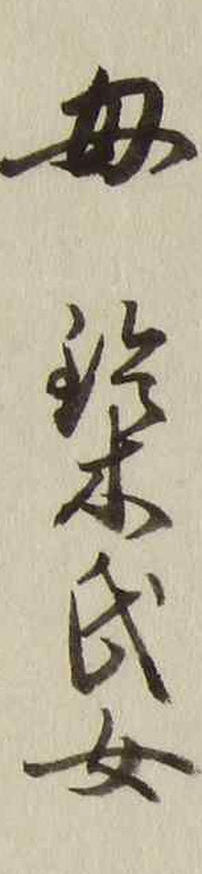母鈴木氏女

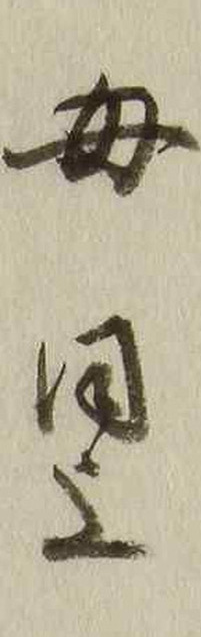母同上
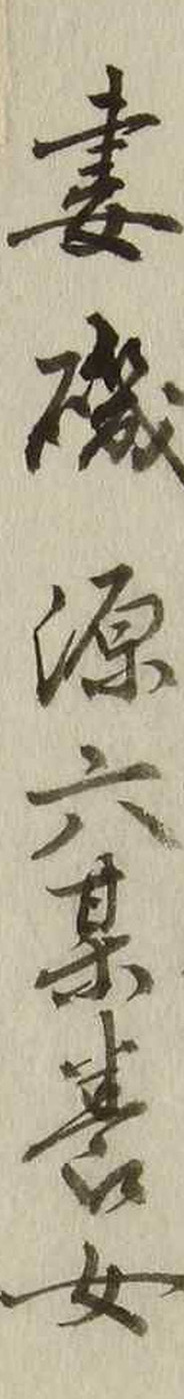妻磯源六某養女
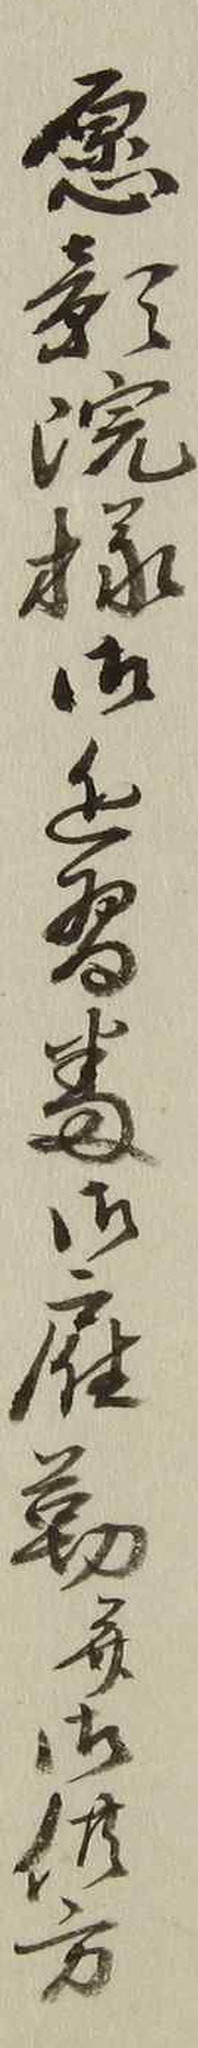愿彰院様御近習番御雇勤并御供方
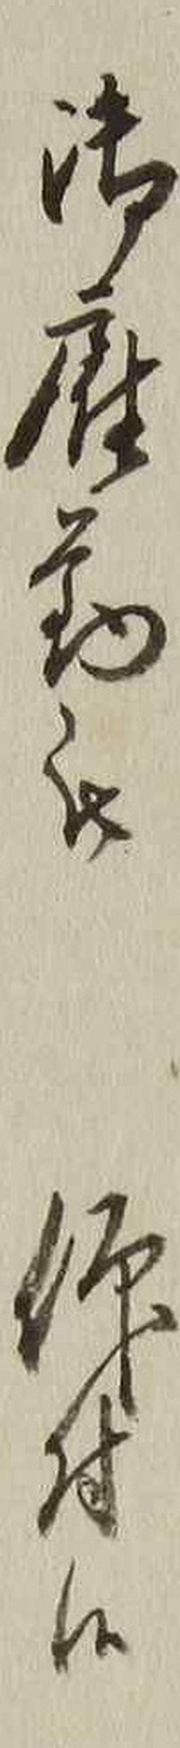御雇勤被仰付候
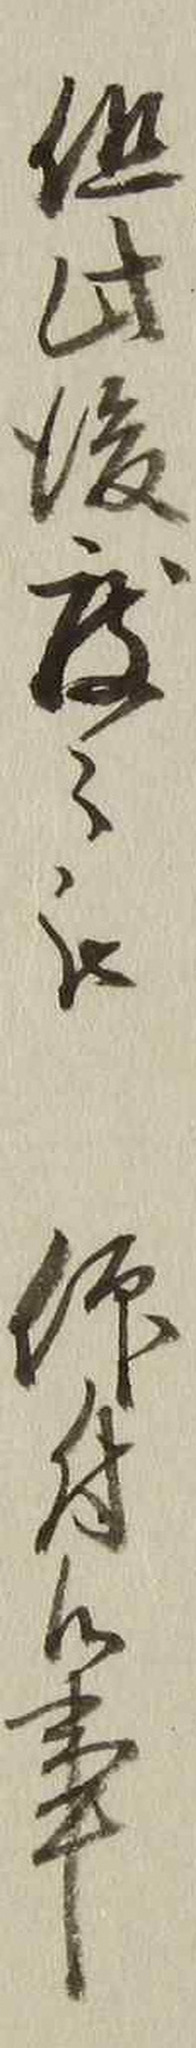但此後度々被仰付候事
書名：諸士系譜　巻之31　い之部31
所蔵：会津若松市立会津図書館
